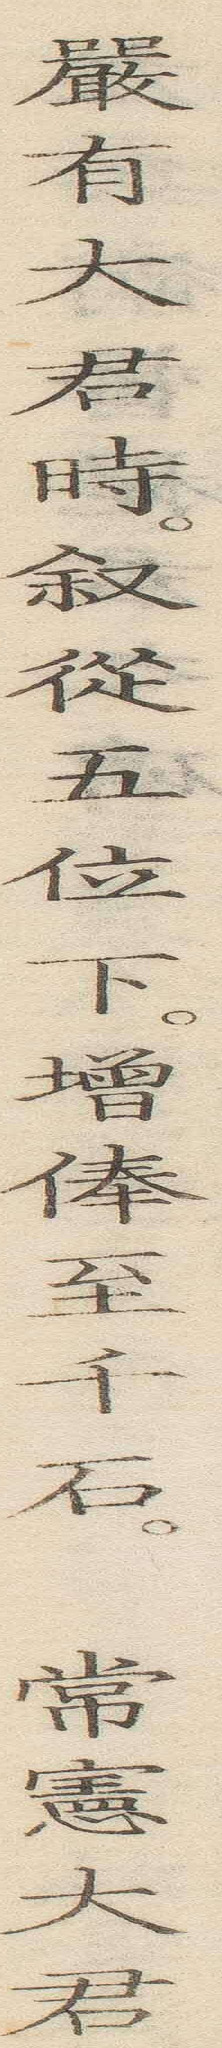嚴有大君時。叙從五位下。增俸至千石。常憲大君
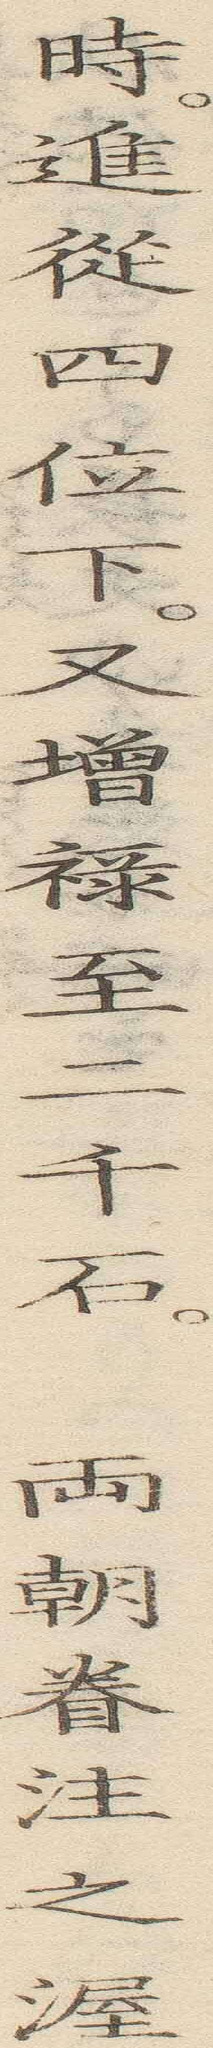時。進從四位下。又增禄至二千石。両朝眷注之渥
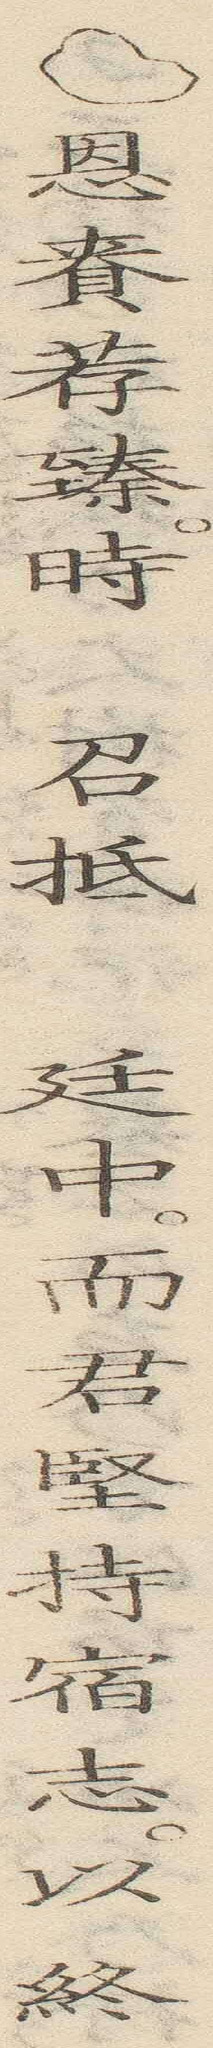▢恩賚荐臻。時召抵廷中。而君堅持宿志。以終
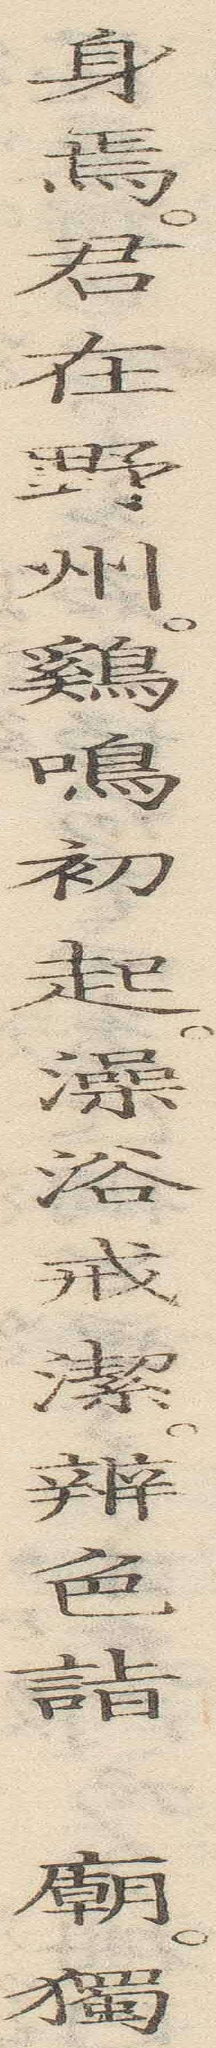身焉。君在野州。鷄鳴初起。澡浴戒潔。辨色詣廟。獨
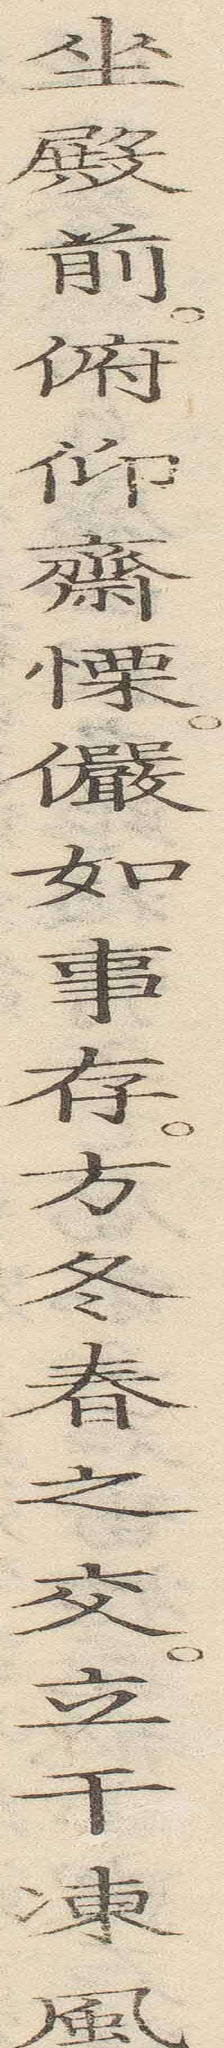坐殿前。俯仰齋慄。儼如事存。方冬春之交。立干凍風
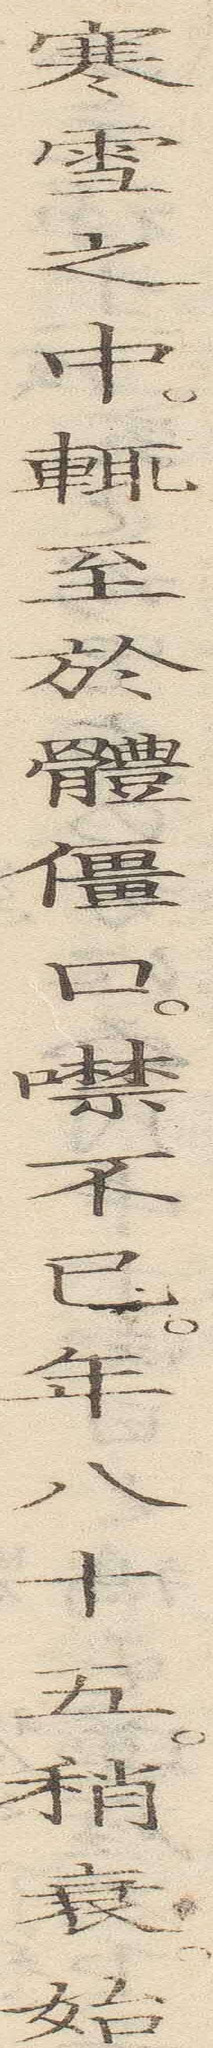寒雪之中。輒至於體僵口。噤不已。年八十五。稍衰。始
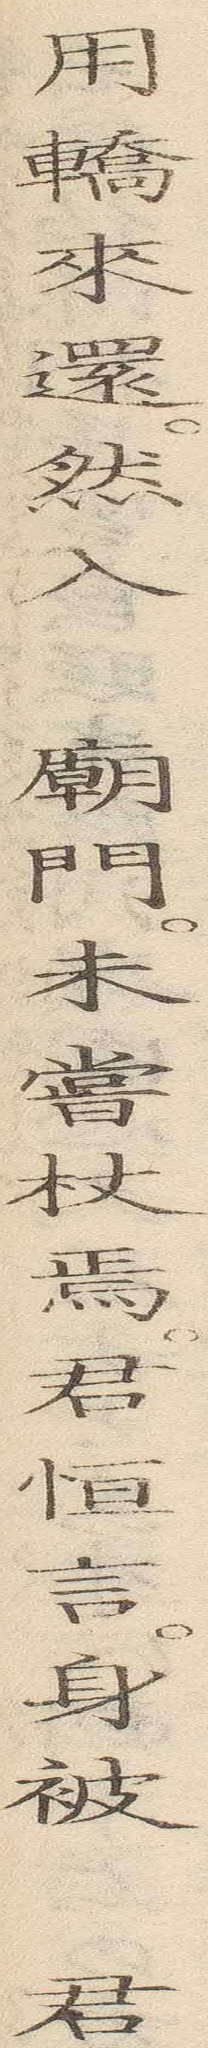用轎來還。然入廟門。未嘗杖焉。君恒言。身被君
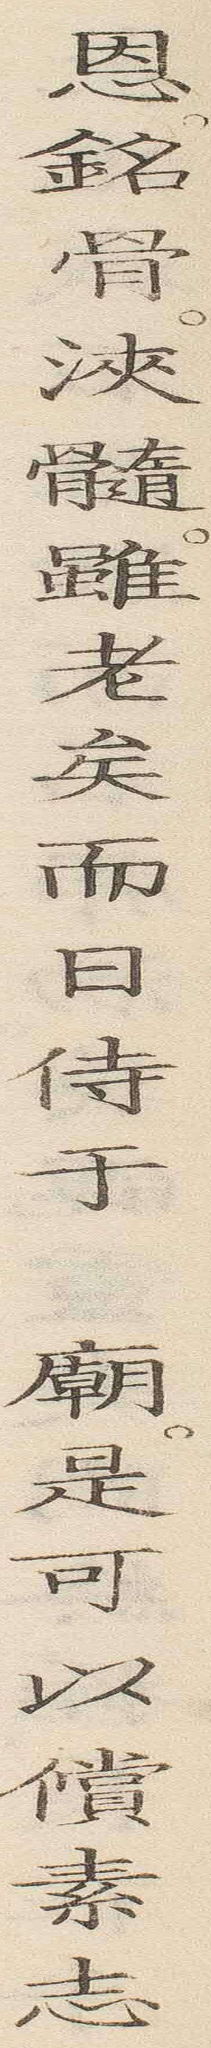恩。銘骨。浹髓。雖老矣而日侍于廟。是可以償素志
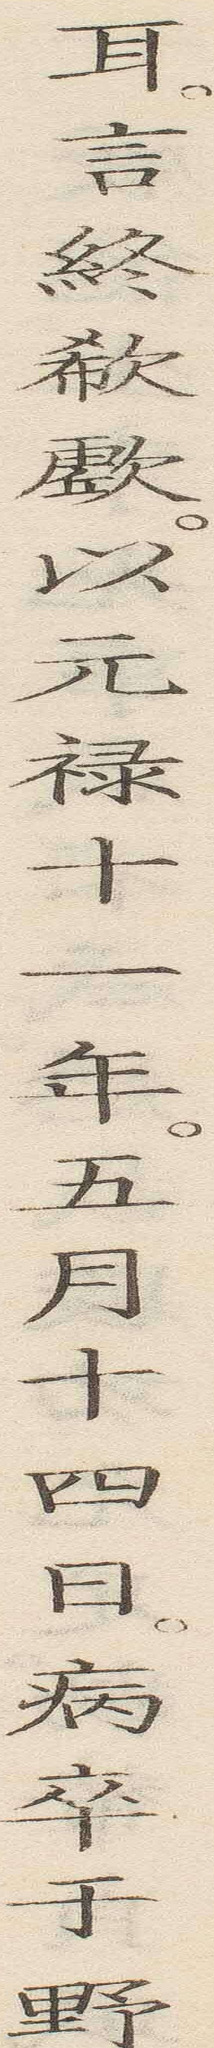耳。言終欷歔。以元禄十一年。五月十四日。病卒于野
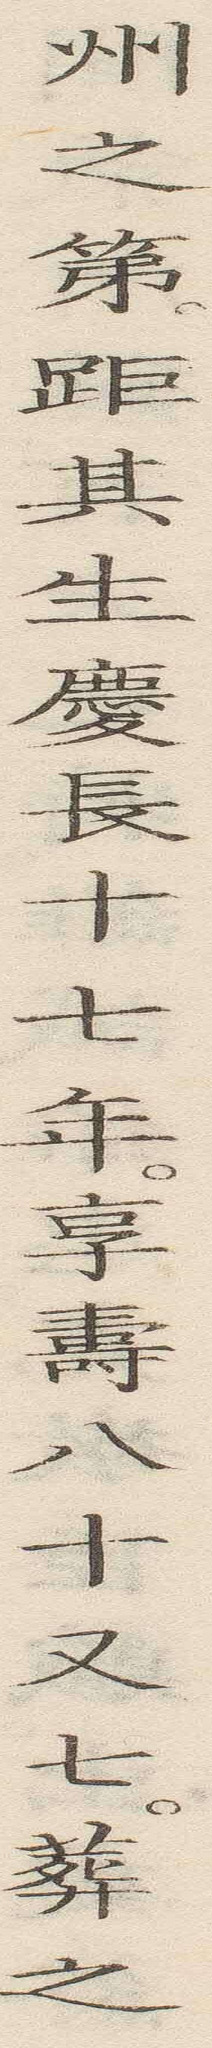州之第。距其生慶長十七年。享壽八十又七。葬之
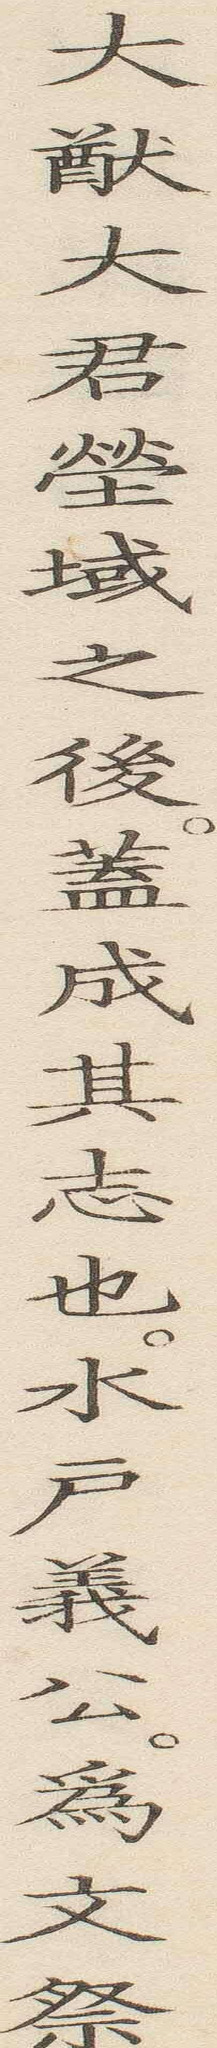大猷大君塋域之後。蓋成其志也。水戸義公。爲文祭
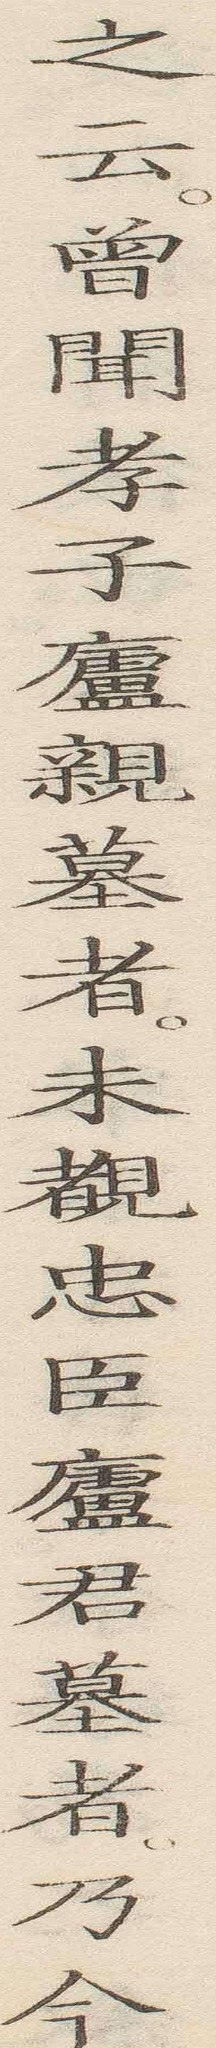之云。曾聞孝子廬親墓者。未覩忠臣廬君墓者。乃今
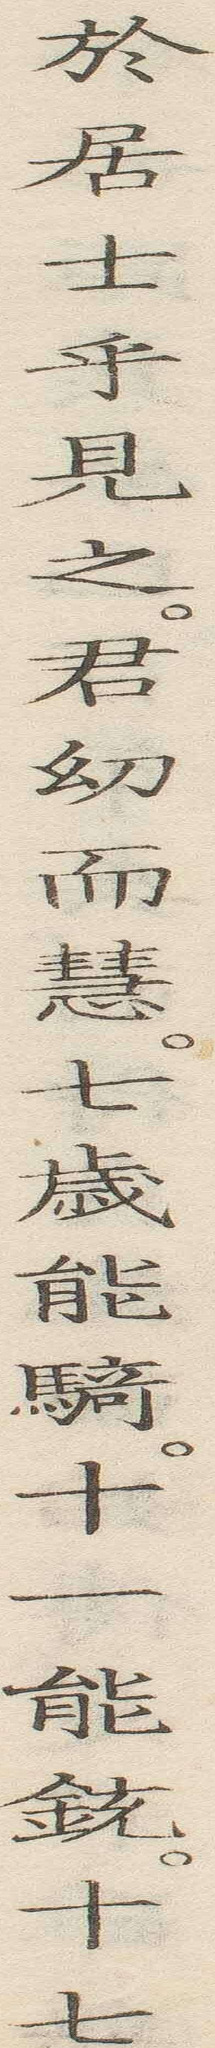於居士乎見之。君幼而慧。七歳能騎。十一能鉉。十七
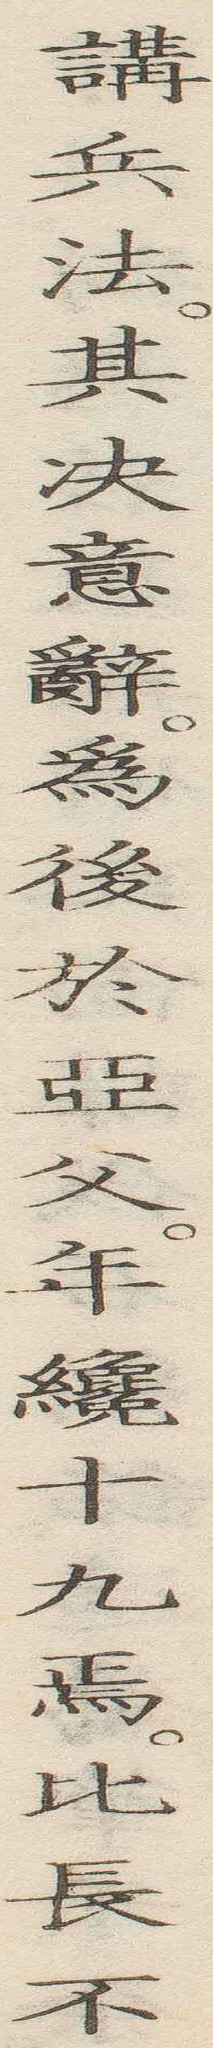講兵法。其決意辭。爲後於亞父。年纔十九焉。比長不
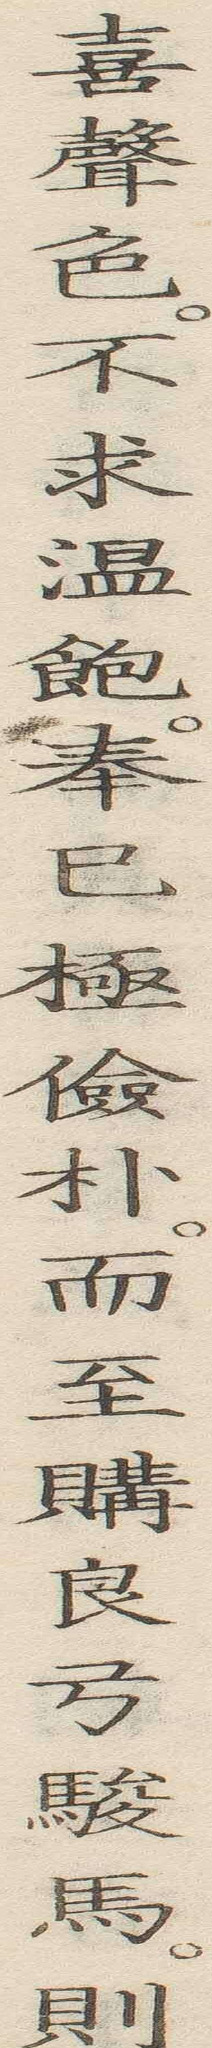喜聲色。不求温飽。奉巳極儉朴。而至購良亏駿馬。則
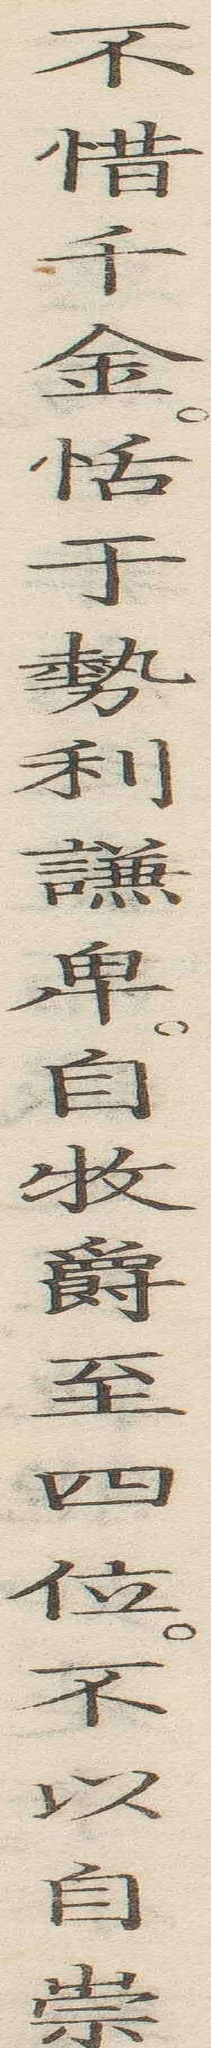不惜千金。恬于勢利譙卑。自牧爵至四位。不以自崇
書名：日光山志
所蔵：東京学芸大学附属図書館 国文学研究資料館
